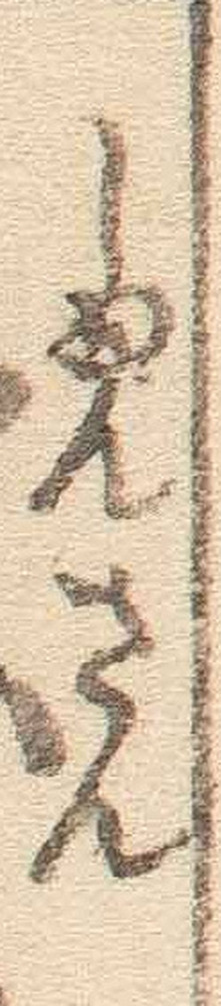しゆんきく
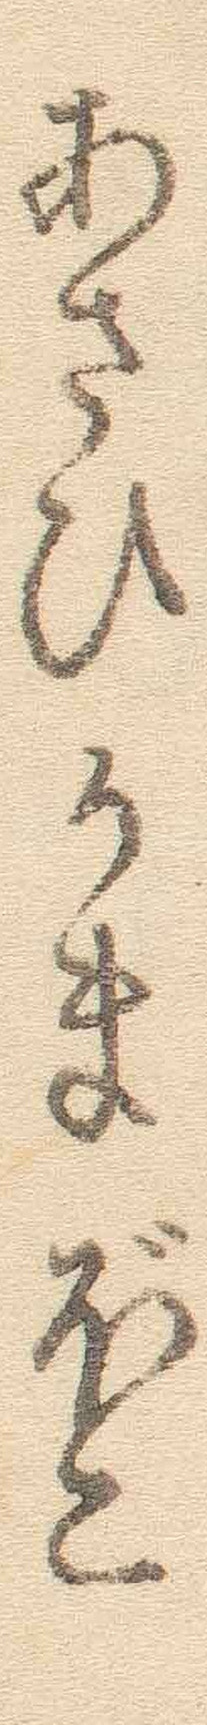あま鯛かまぼこ
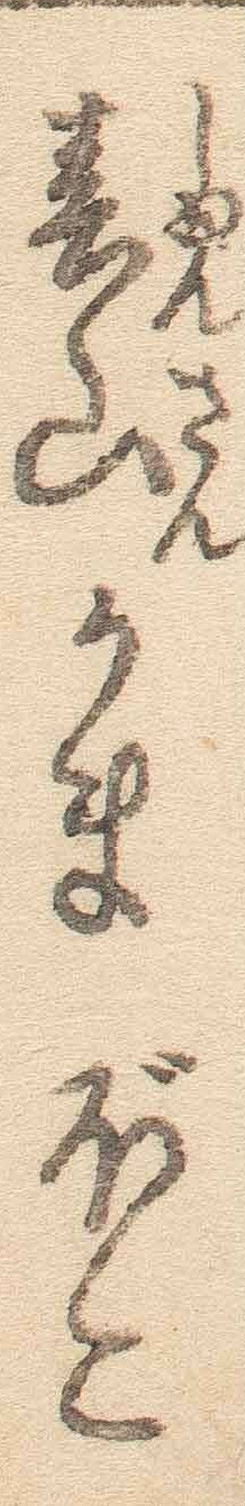春山かまぼこ

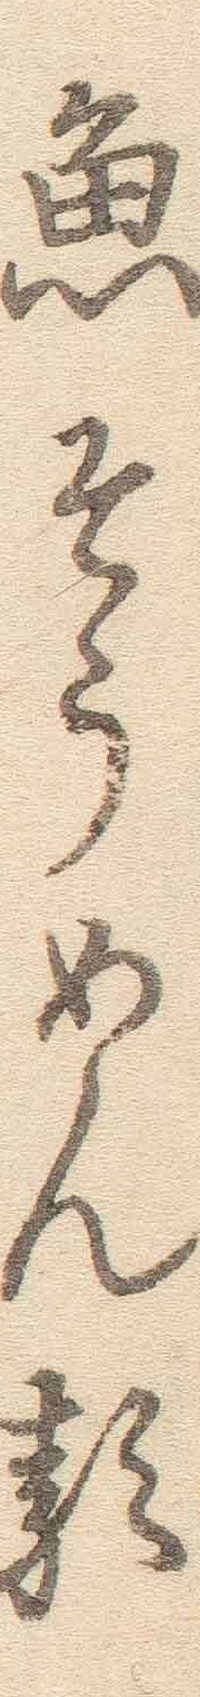魚そうめん類
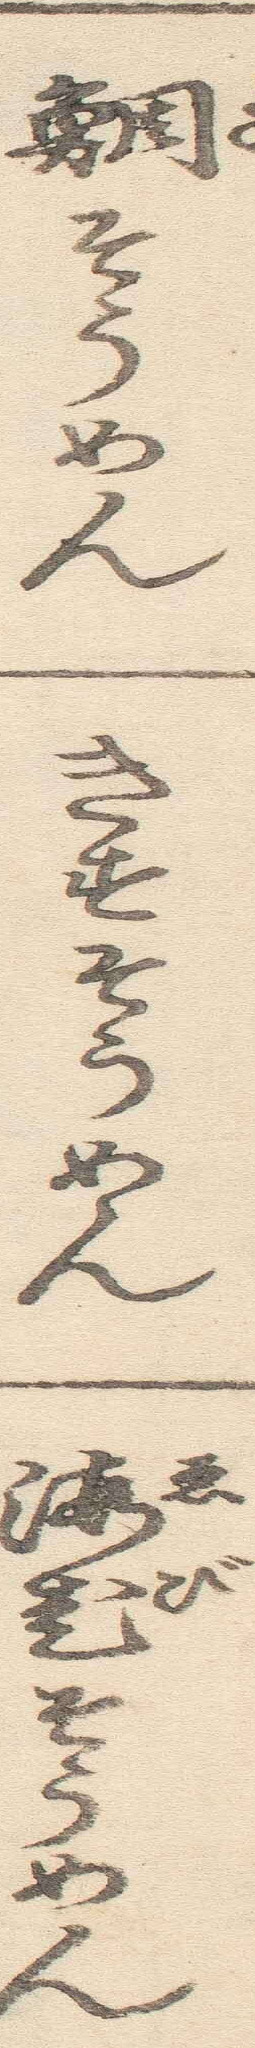鯛そうめんきすそうめん海老そうめん
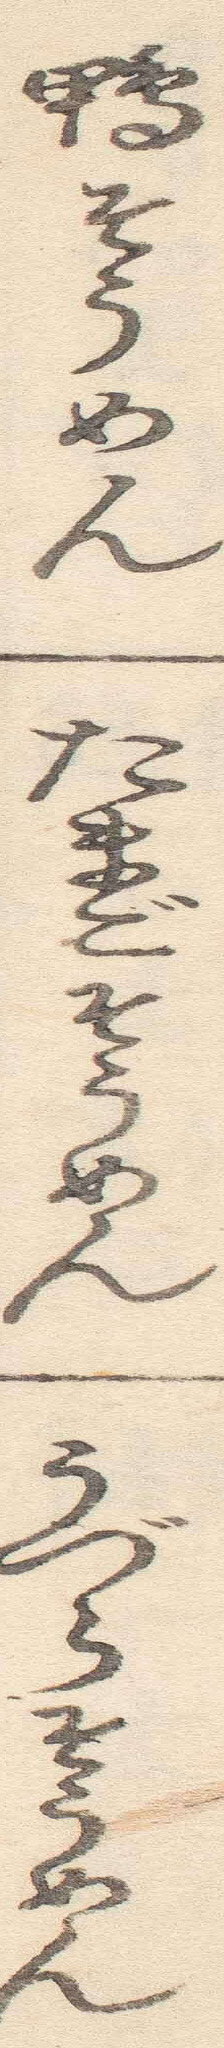鴨そうめんたまごそうめんうづらそうめん
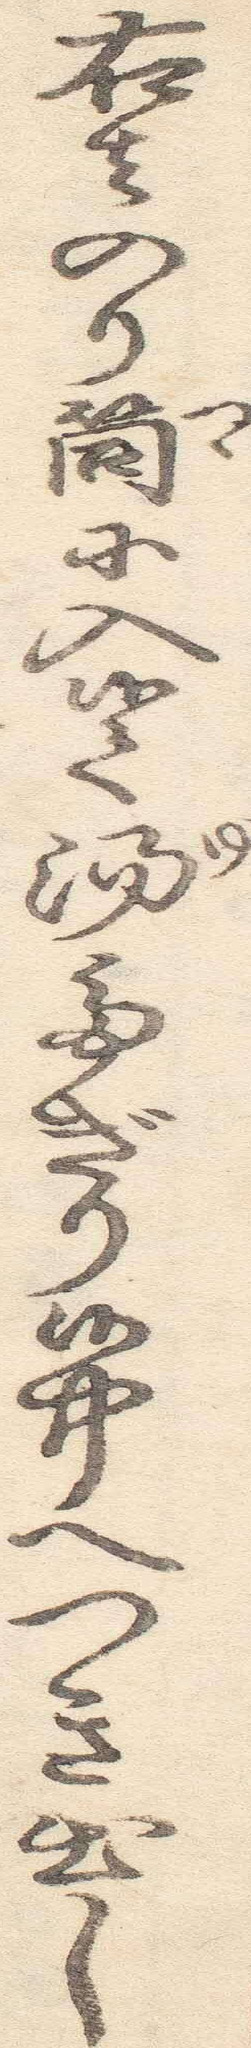右はのり筒に入候て湯たぎり候中へつき出し
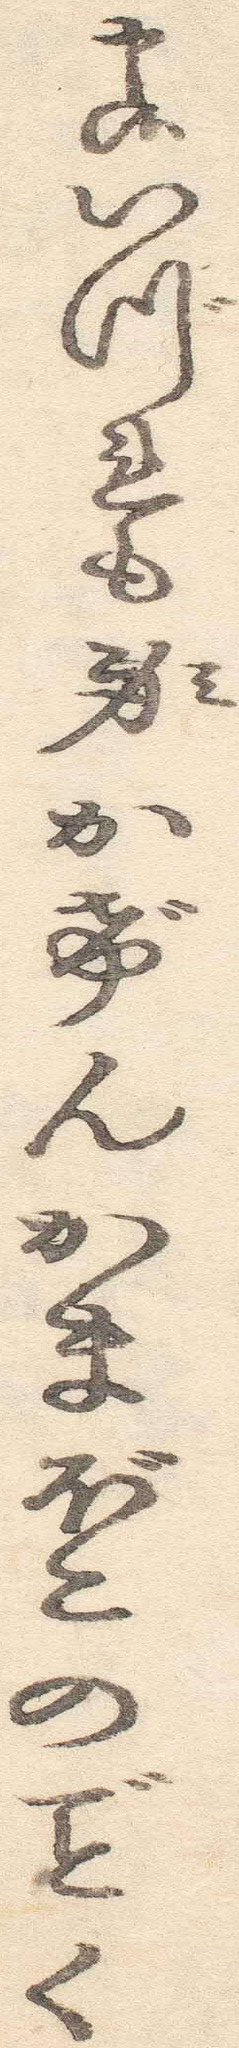申候いづれも身かげんかまぼこのごとく
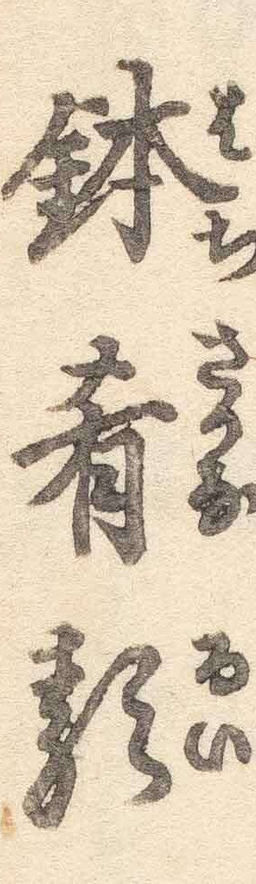鉢肴類
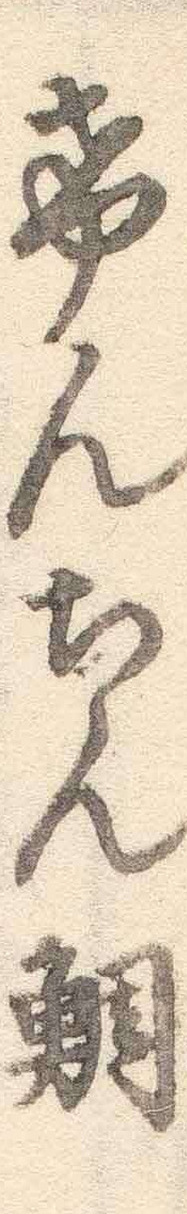けんちん鯛
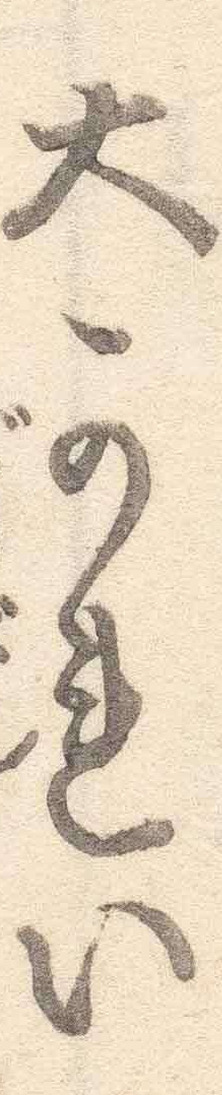大かれい
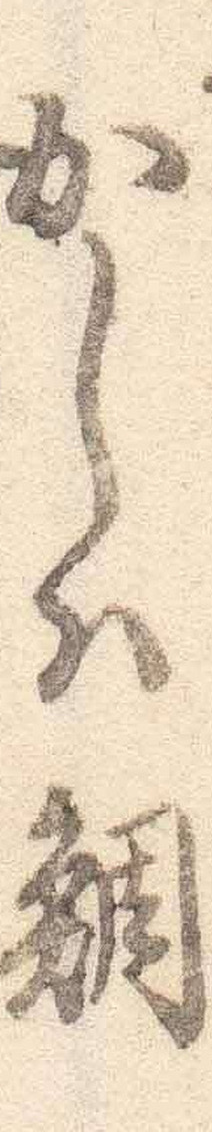かしは鯛
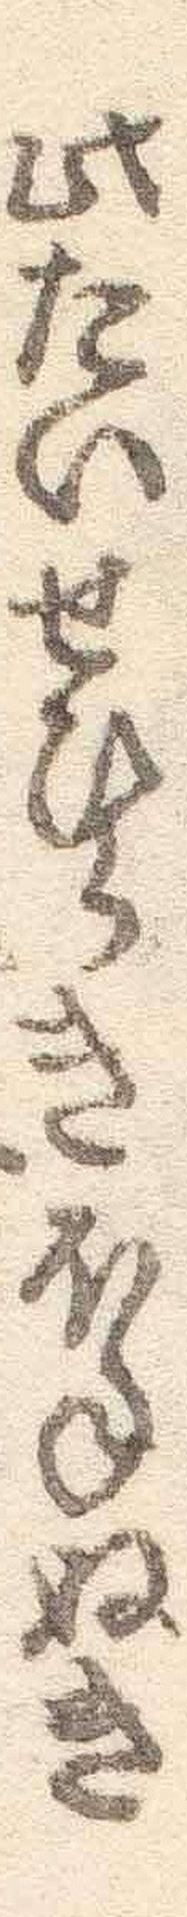此たいせひらきほねぬき
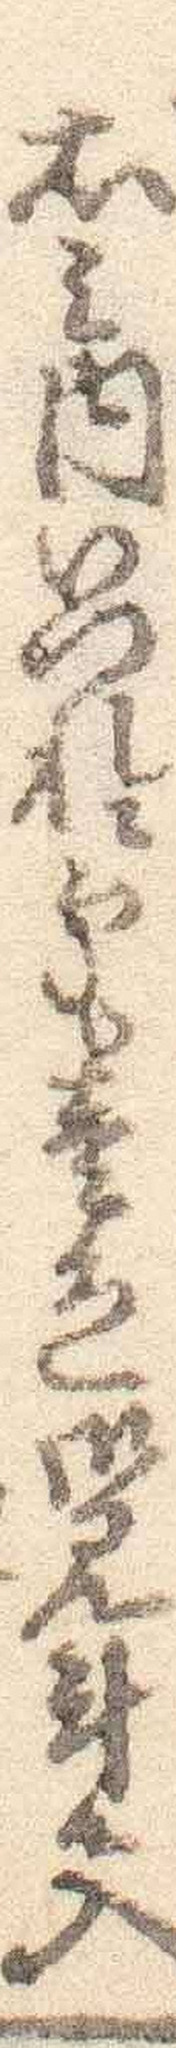右之内いつれにても壱色御見斗入
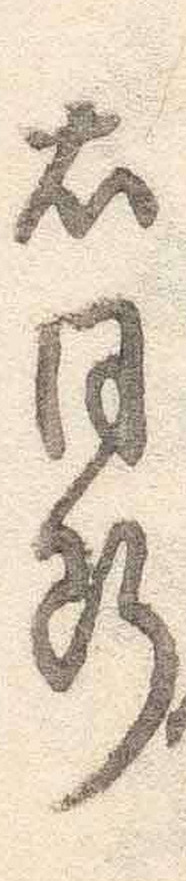右同断
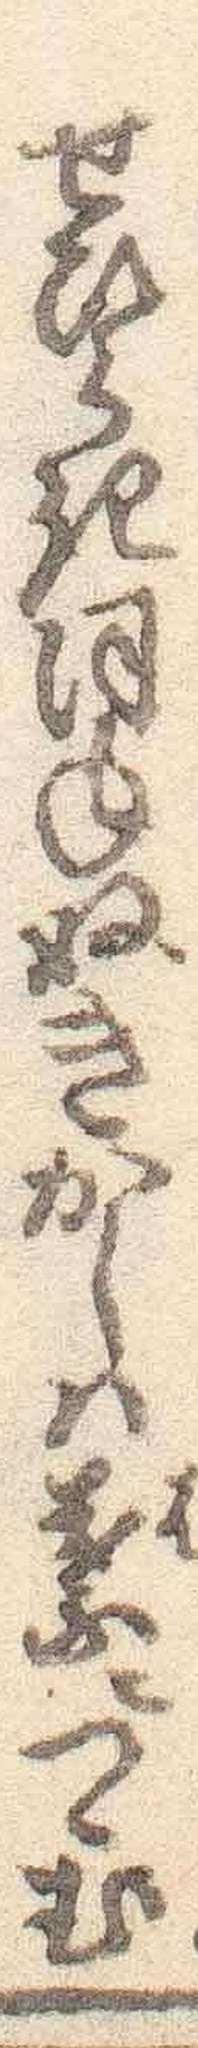せひらきほねぬきかしは葉につゝむ
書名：料理通
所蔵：東京学芸大学附属図書館 国文学研究資料館
